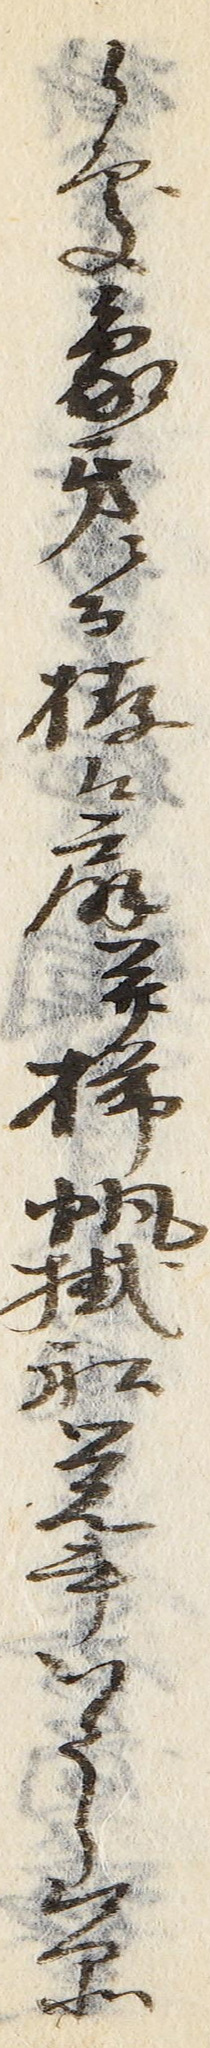候處象牙ニ而拵候扇幷櫛帆掛舩覚書いたし候品
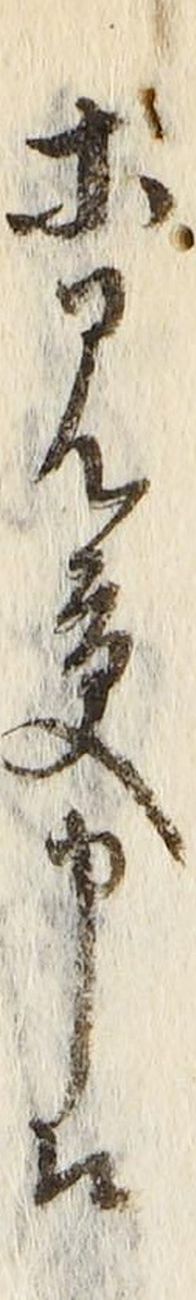等見受申候
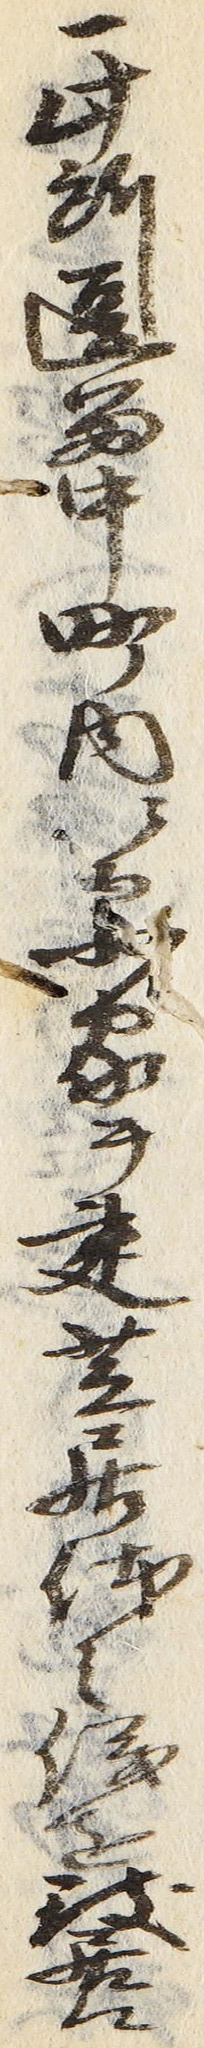一此所逗留中町内ニ而小家ヲ建芝居体之儀を致居候
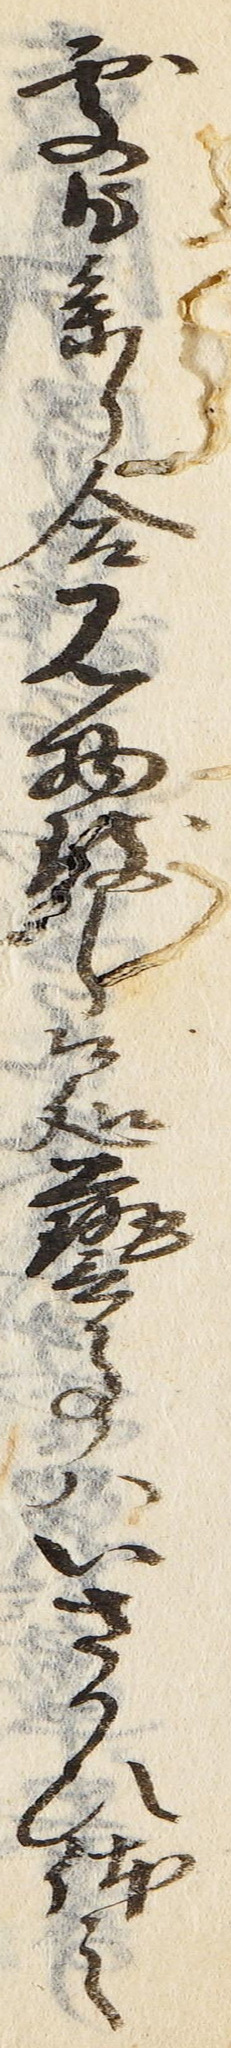處江参り合見物致し候処藝事ハいさかひ体之
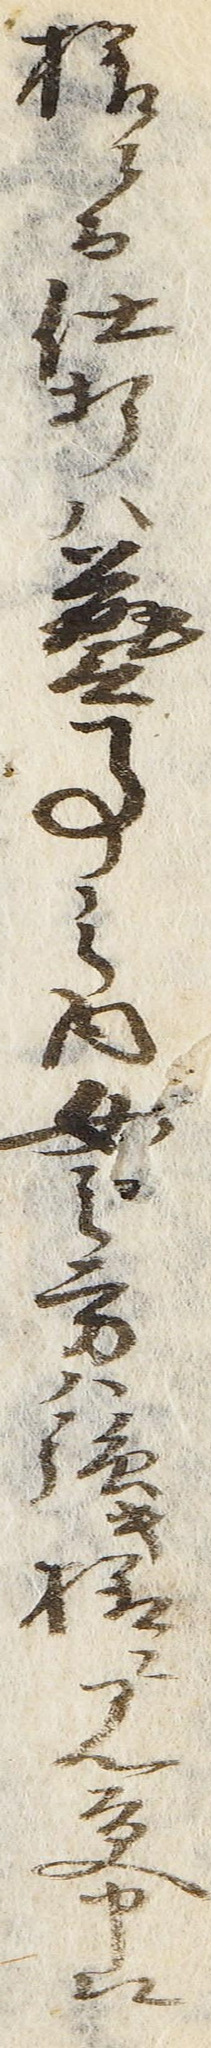様ニ而仕打ハ藝事之内女之方ハ強キ様ニ見受申候
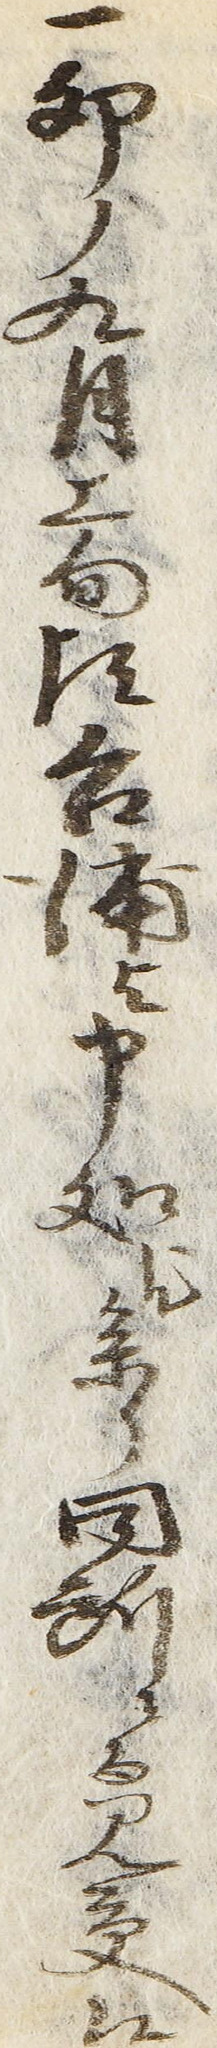一卯ノ九月上旬頃乍浦と申処江参り同所ニ而見受候
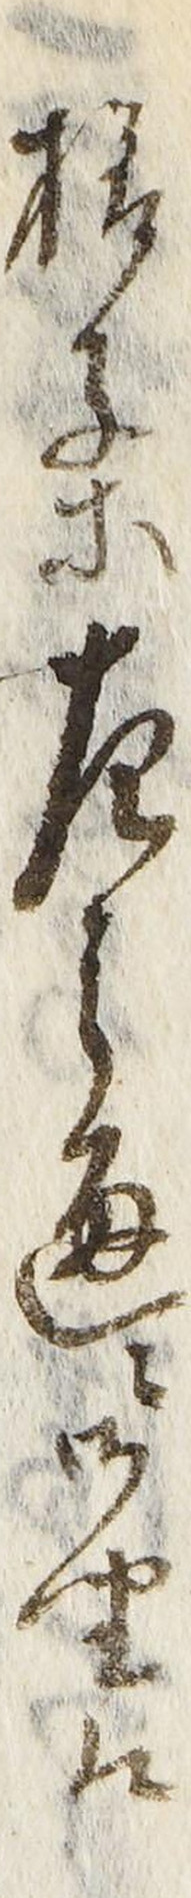様子等左之通ニ御座候
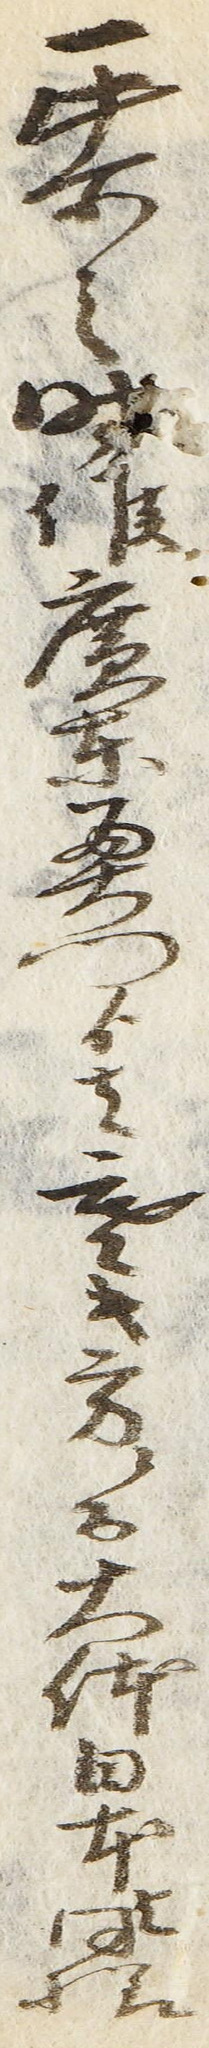一此所之時候廣東奥門ゟ者寒キ方ニ而大体日本と同様
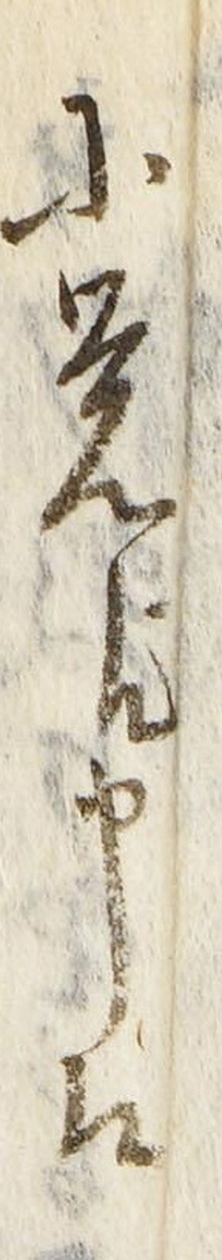に覚江申候
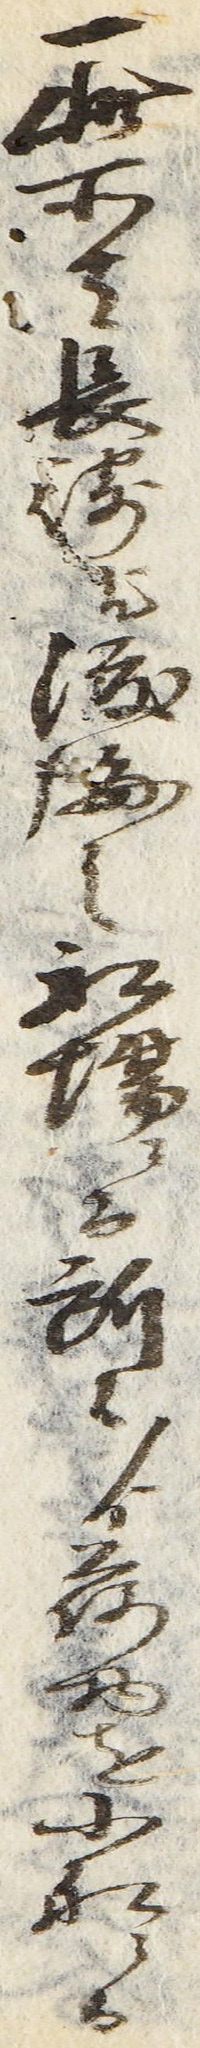一此所者長崎江渡海之舩塲ニ而所々ゟ荷物を小舩ニ而
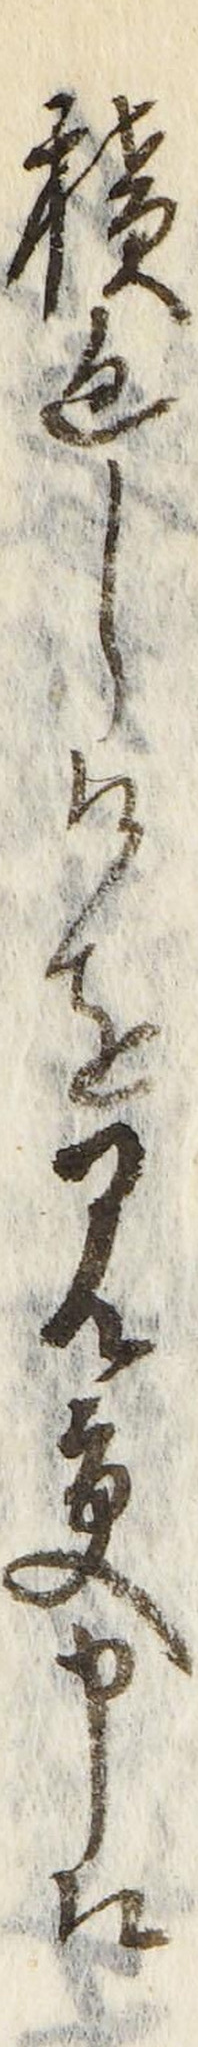積廻し候を見受申候
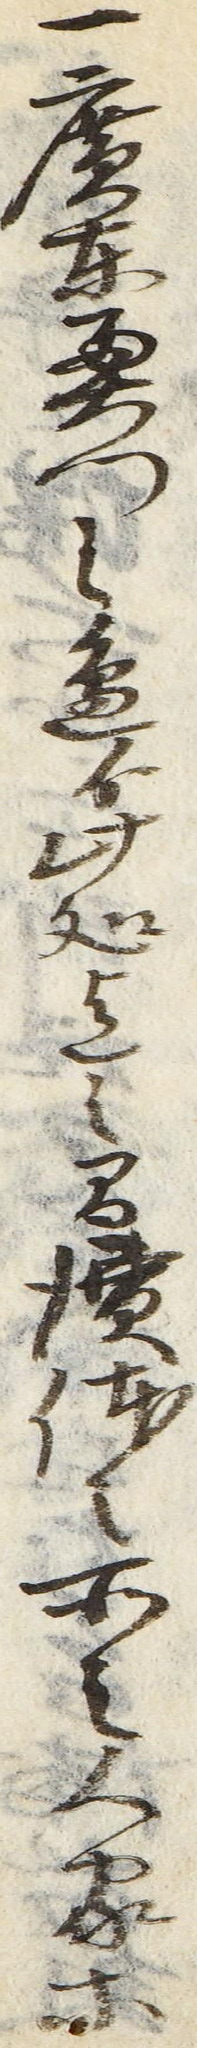一廣東奥門之邊ゟ此処迄之間濱体之所之人家等

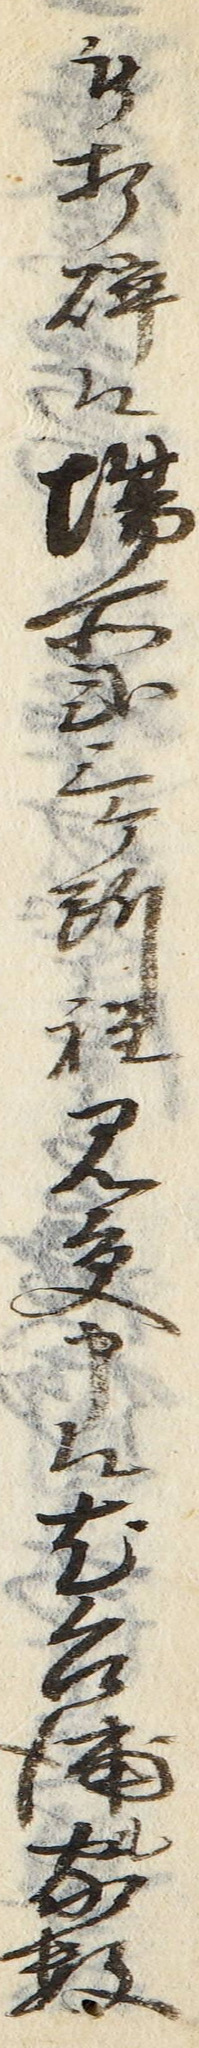被打碎候塲所弐三ケ所程見受申候尤乍浦も家数
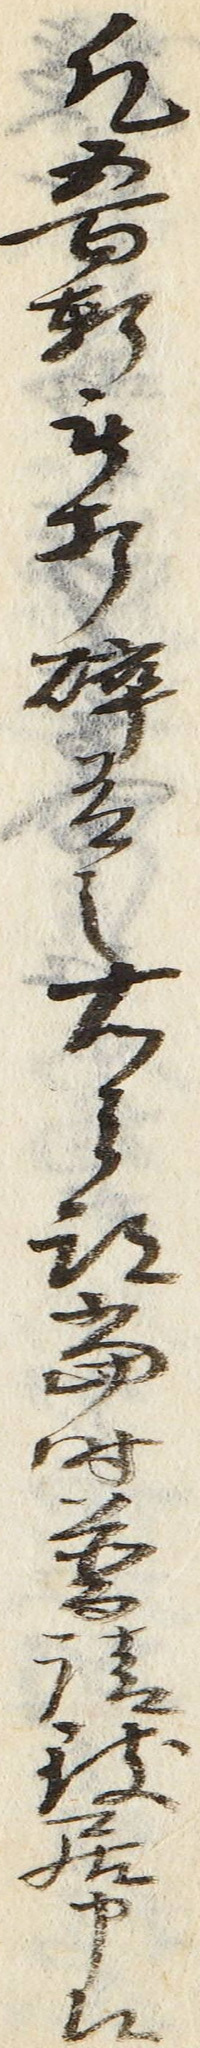凡五百軒被打碎有之右之跡當時普請致居申候
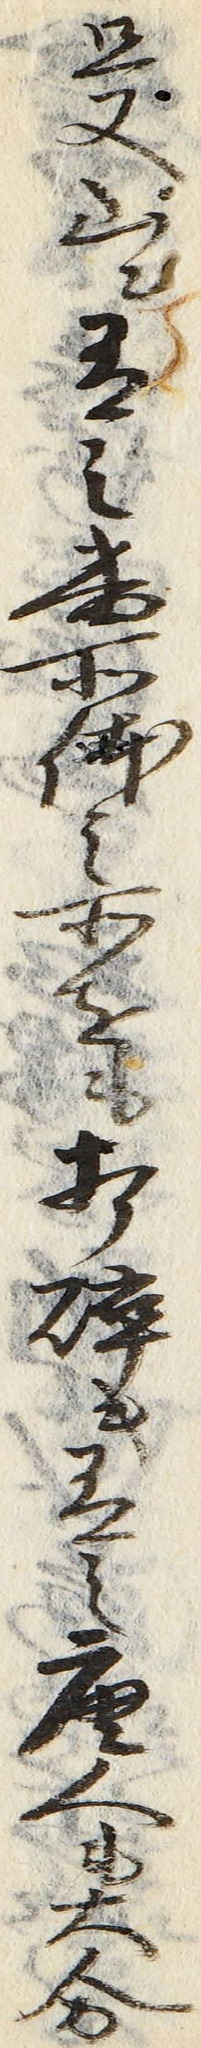且又山々有之番所体之所をも打碎キ有之唐人も大分
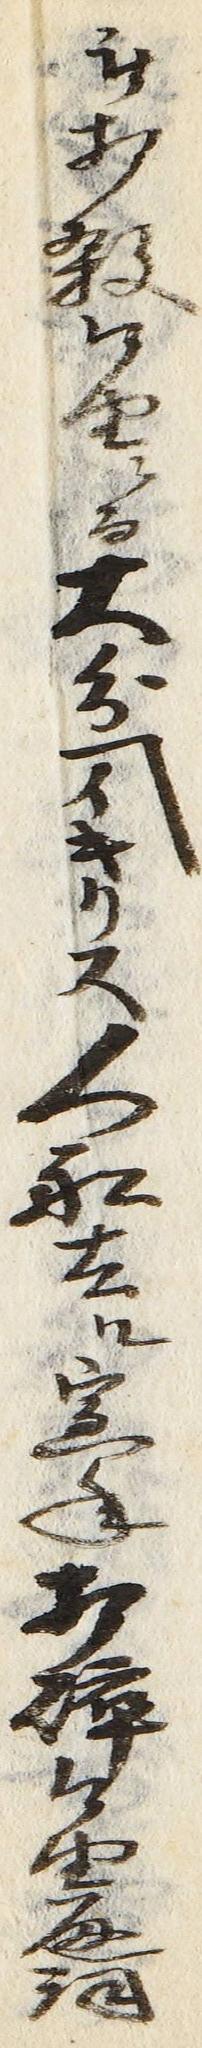被打殺候由ニ而大分「イキリス人舩去ル寅年打碎候由通詞
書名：漂流人善助聞書
